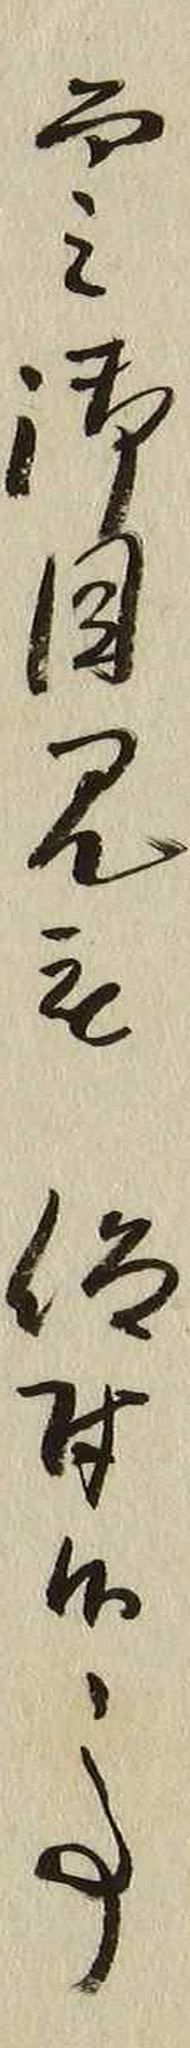而之御目見被仰付候事
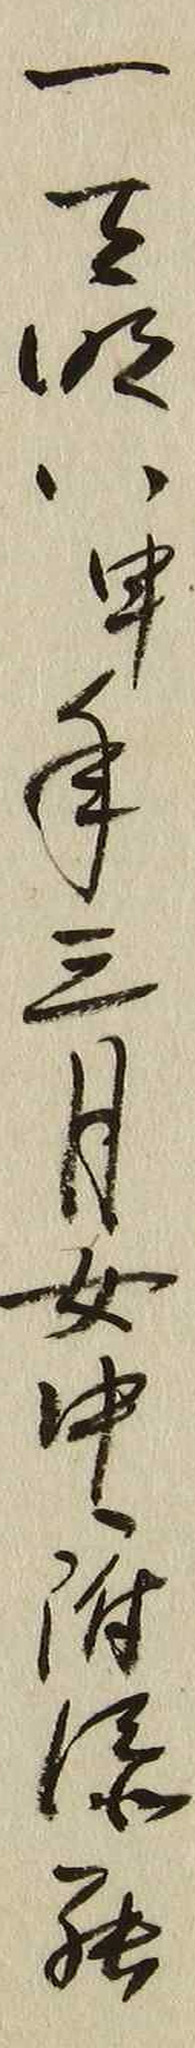一天明八申年三月女中へ附添罷
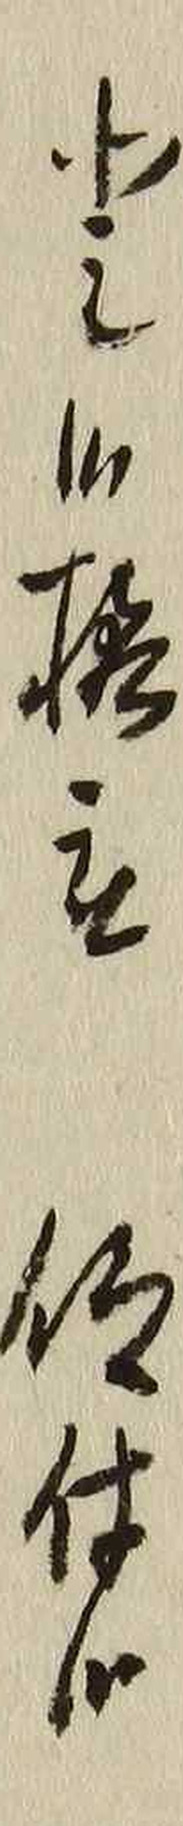登候様被仰付候
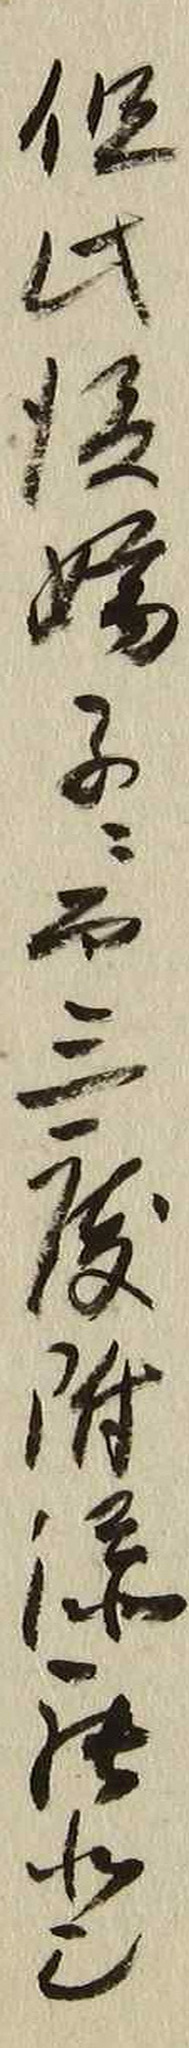但此後嫡子ニ而三度附添罷登
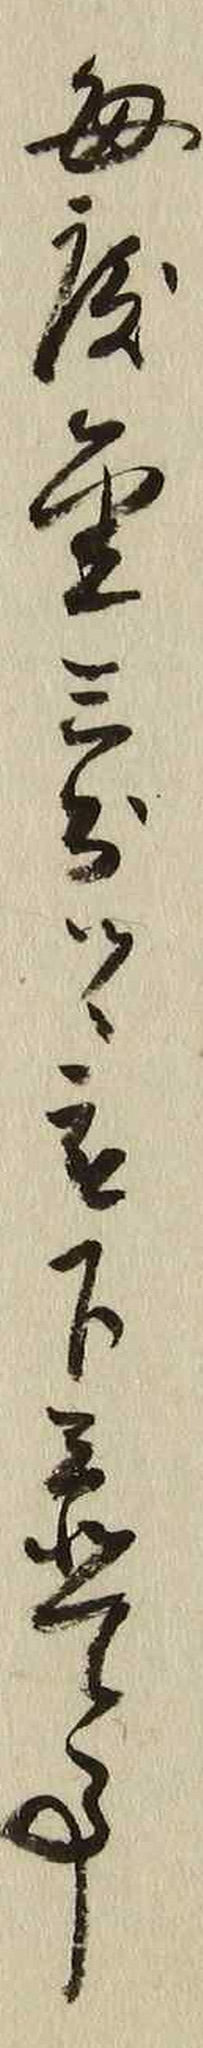毎度金三分ツヽ被下置候事
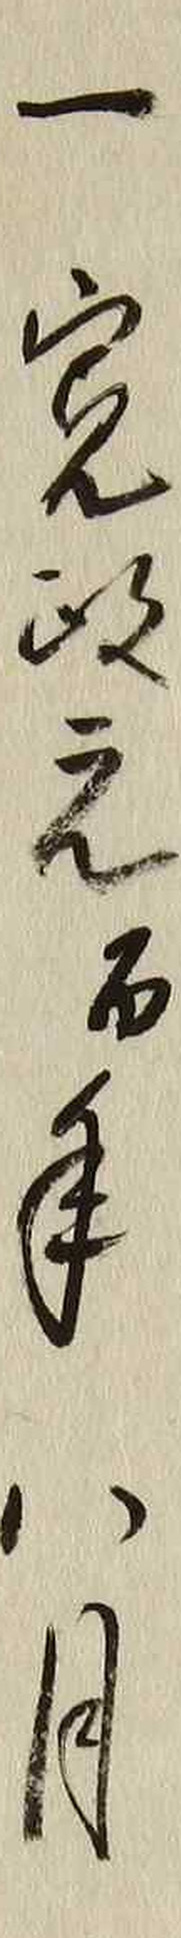一寛政元酉年八月
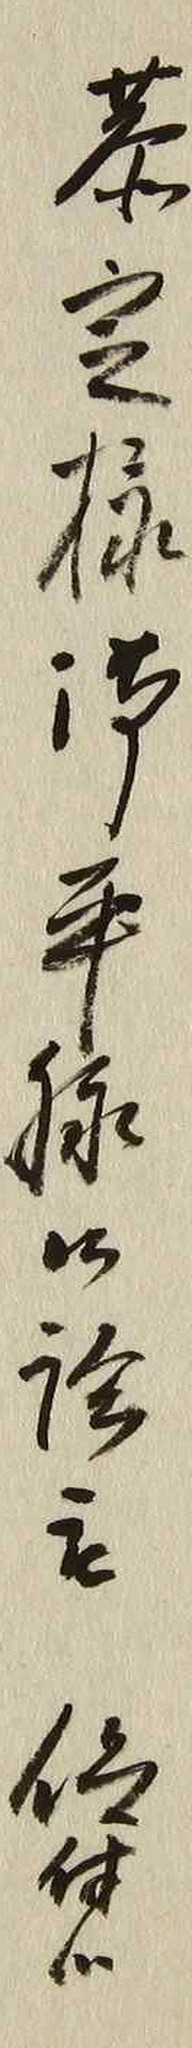恭定様御平脈御診被仰付候
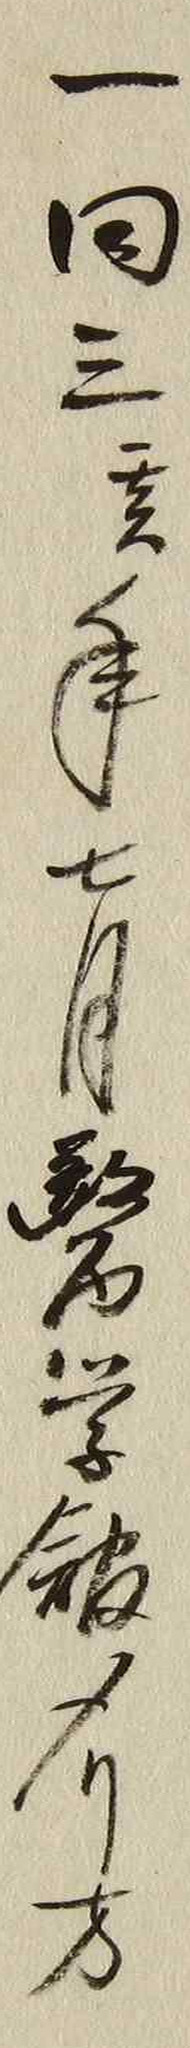一同三亥年七月医学館〆り方
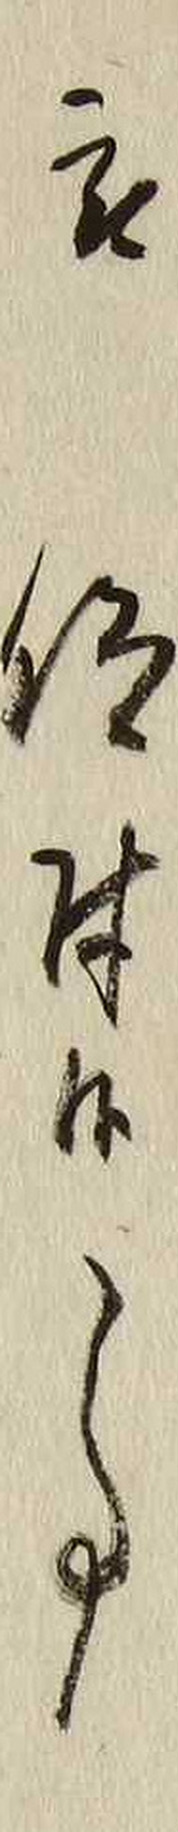被仰付候事
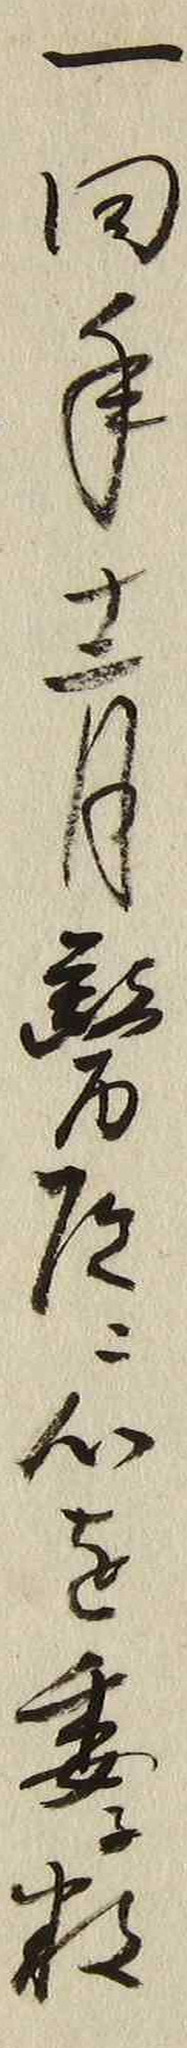一同年十二月医道ニ心を委ね数
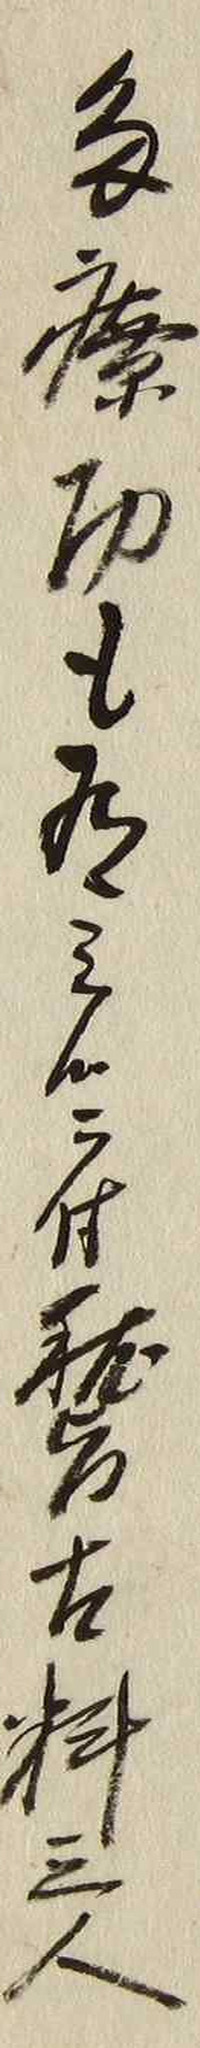多療功も有之候ニ付稽古料三人
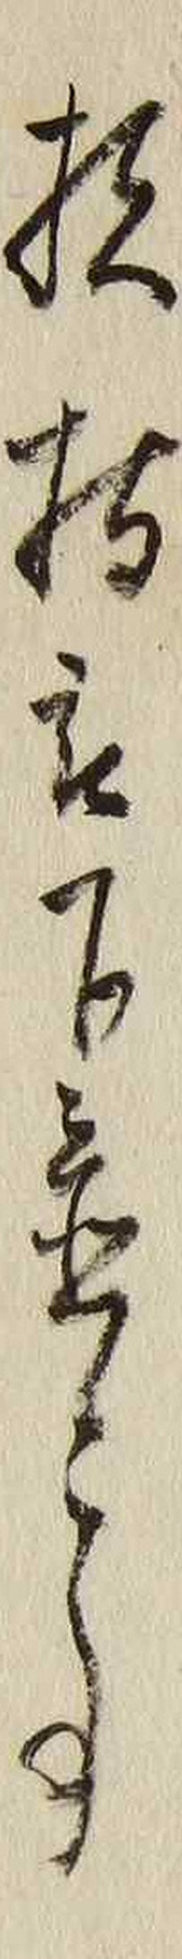扶持被下置候事
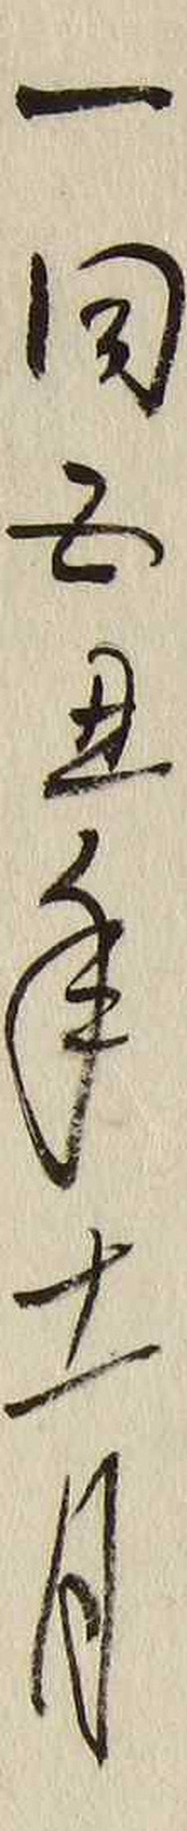一同五丑年十一月
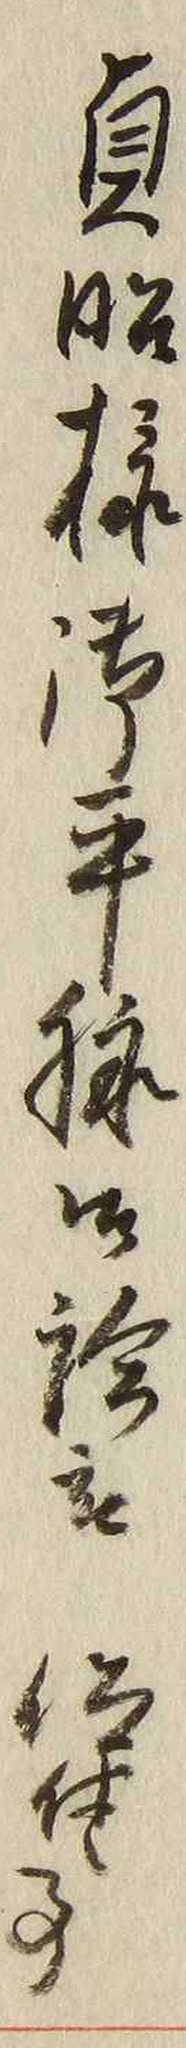貞昭様御平脈御診被仰付候事

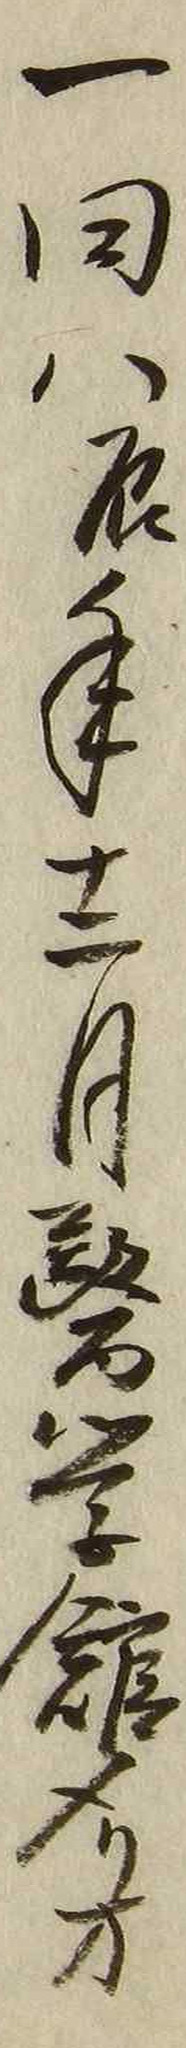一同八辰年十二月医学館〆り方
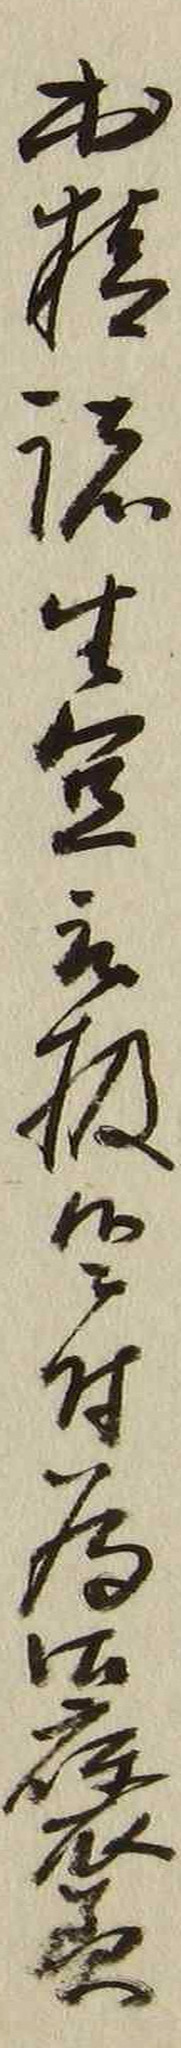出精諸生宣取扱候ニ付為御褒美
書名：諸士系譜　巻之353　す之部3
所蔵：会津若松市立会津図書館
